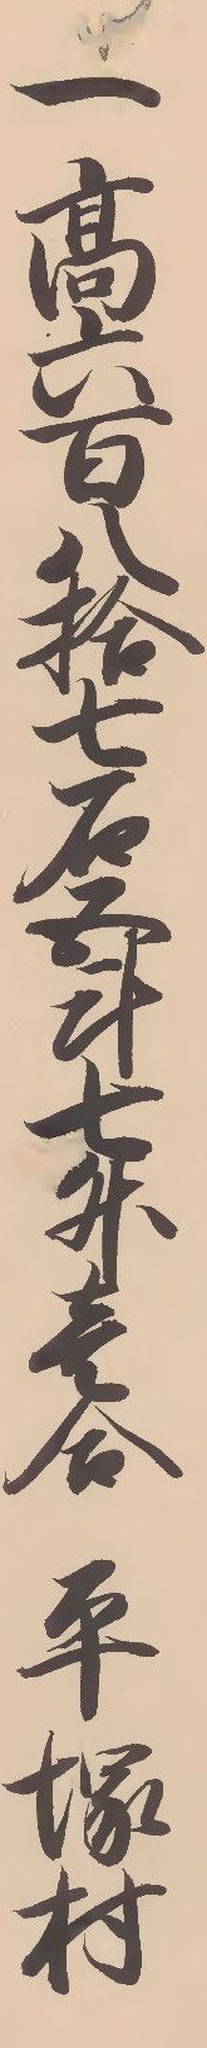一高六百八拾七石五斗七升壱合平塚村

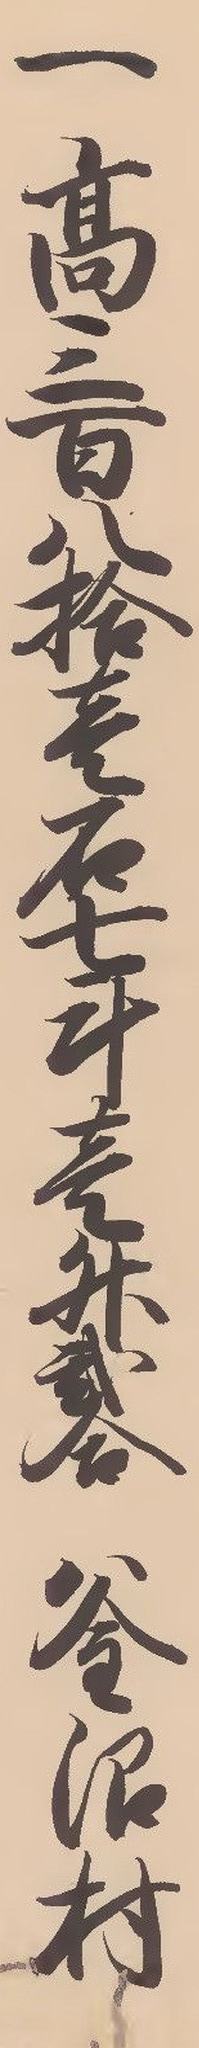一高三百八拾壱石七斗壱升弐合釜沼村
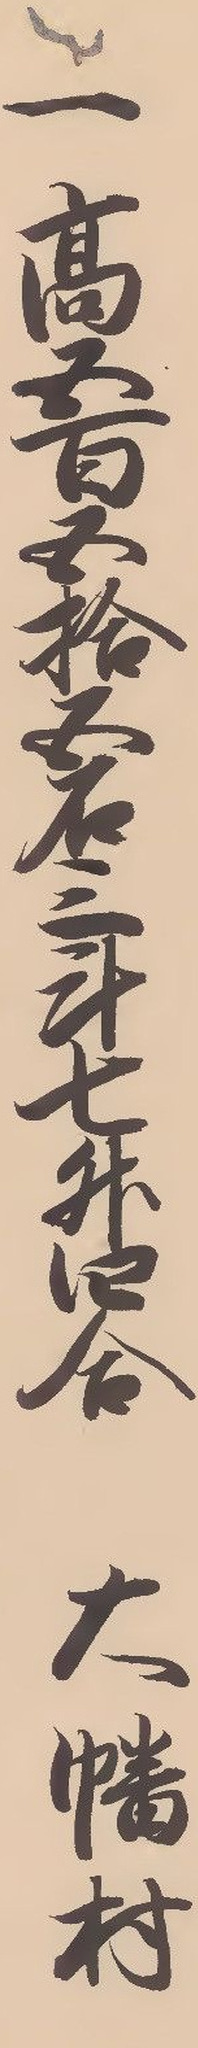一高五百五拾五石三斗七升四合大幡村
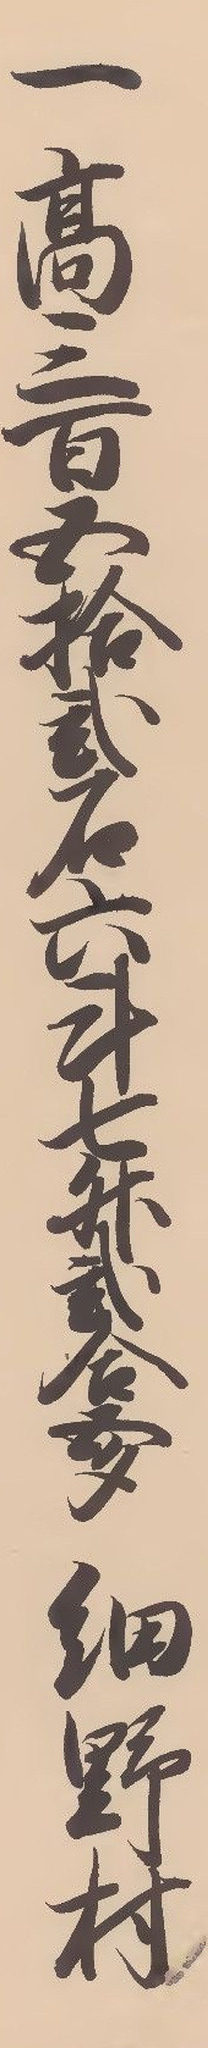一高三百五拾弐石六斗七升弐合五勺細野村
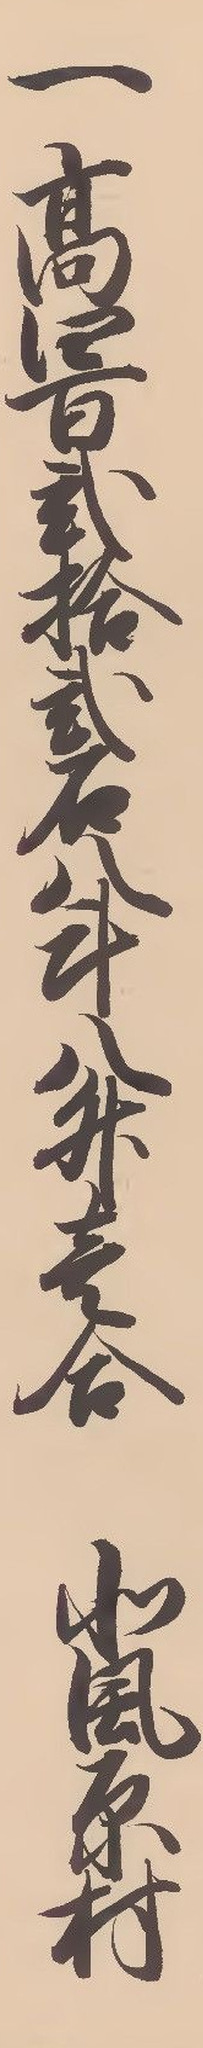一高四百弐拾弐石八斗八升壱合北風原村
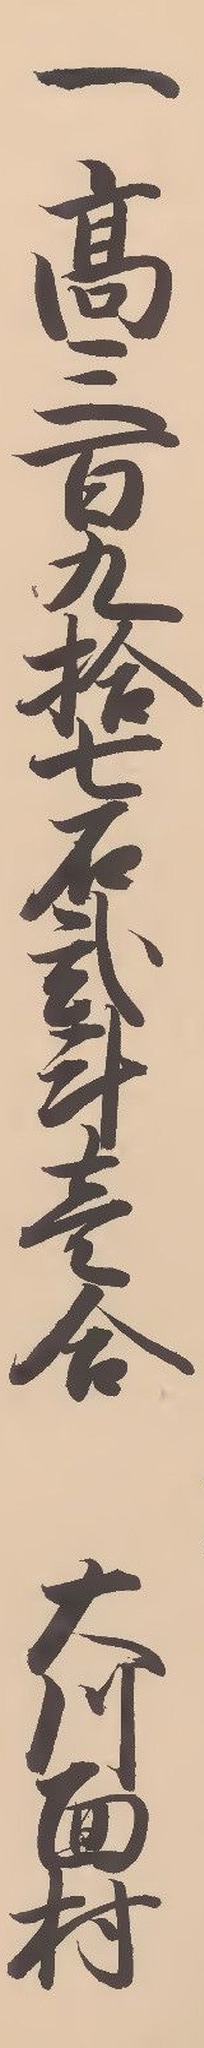一高三百九拾七石弐斗壱合大川面村
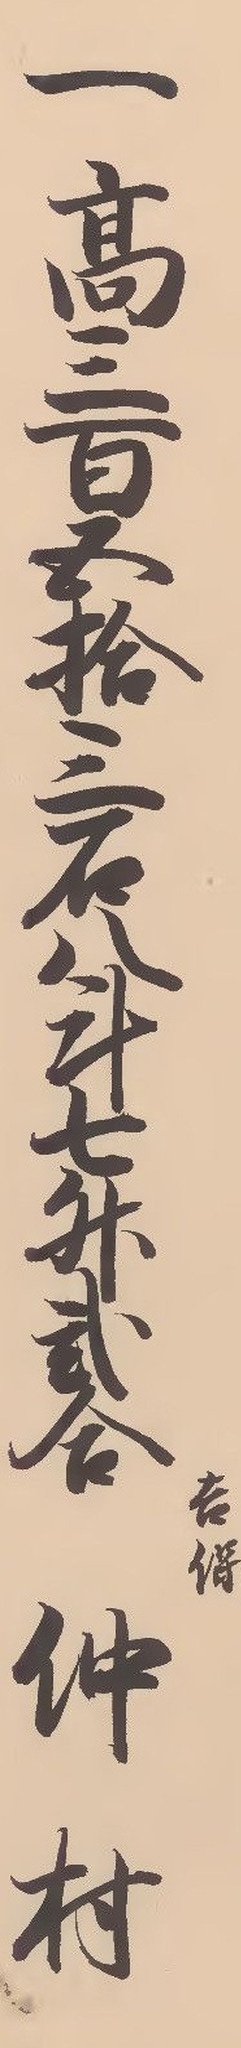一高三百五拾三石八斗七升弐合仲村
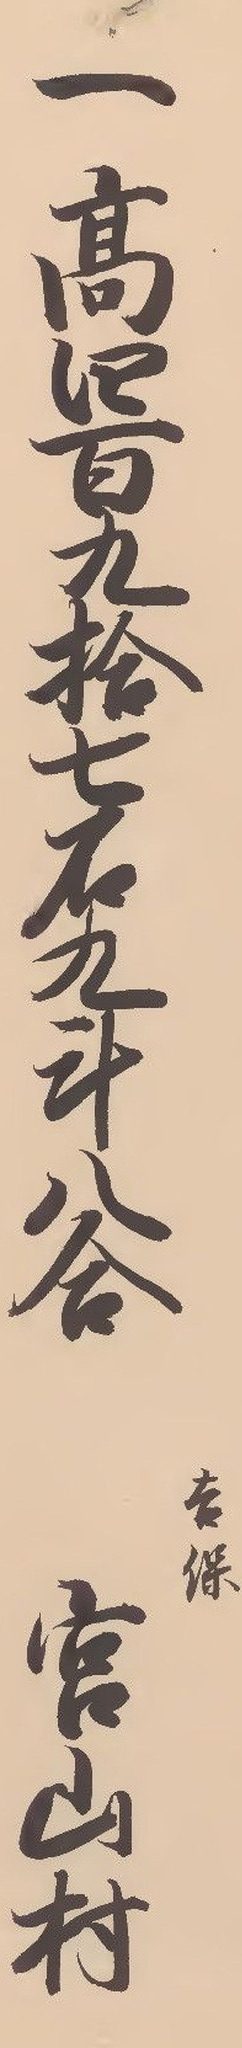一高四百九拾七石九斗八合宮山村
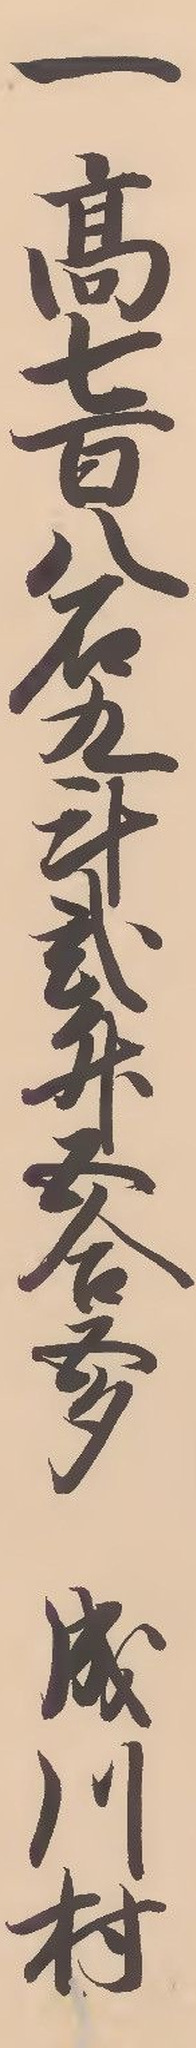一高七百八石九斗弐升五合五勺成川村

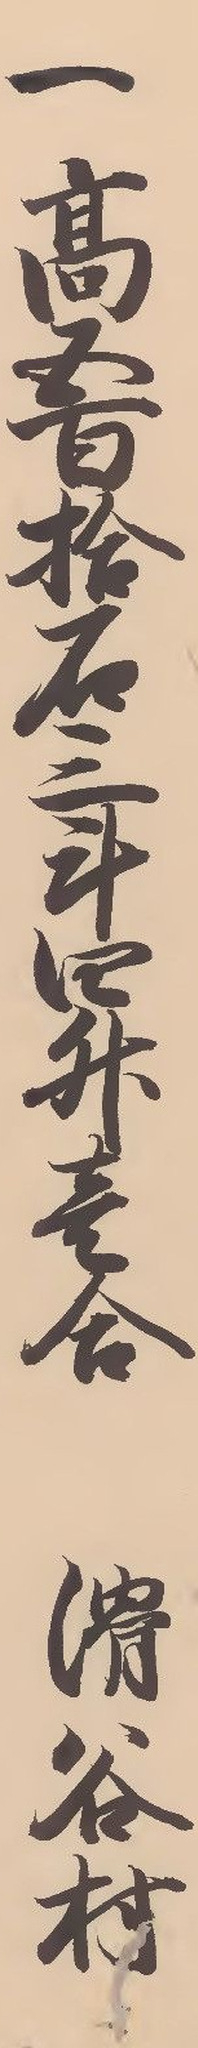一高五百拾石三斗四升壱合滑谷村
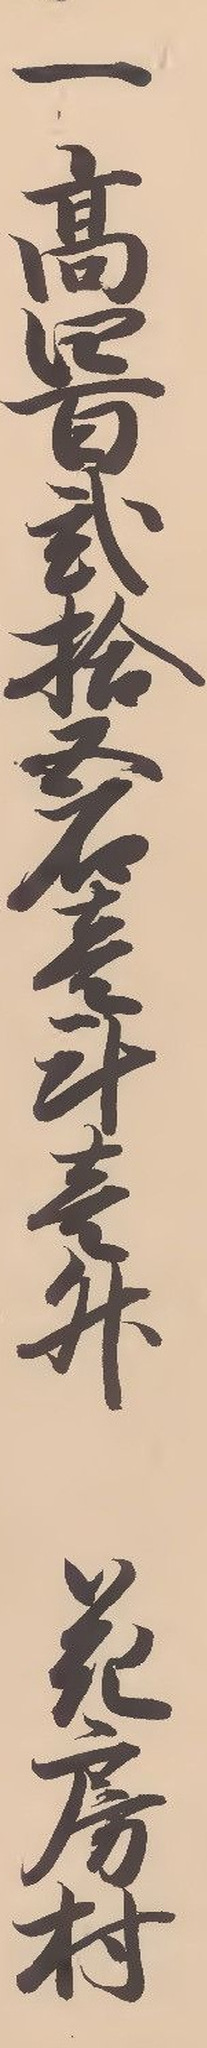一高四百弐拾五石壱斗壱升花房村
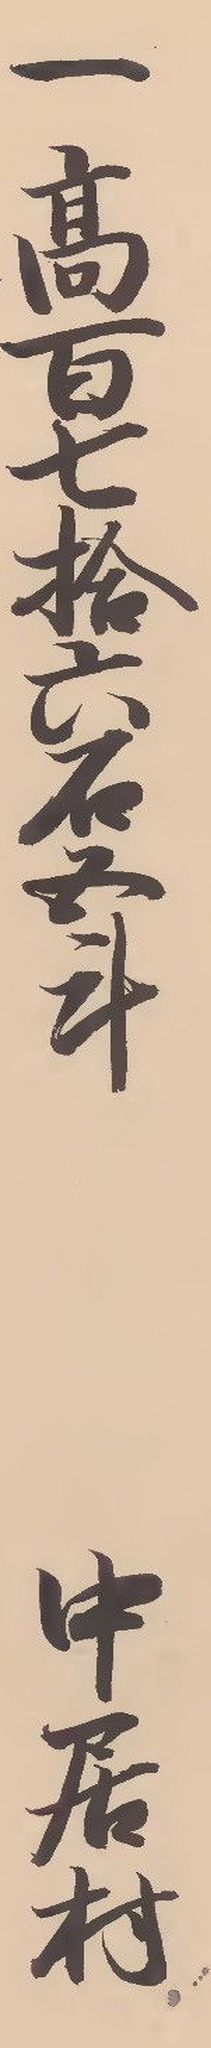一高百七拾六石五斗中居村
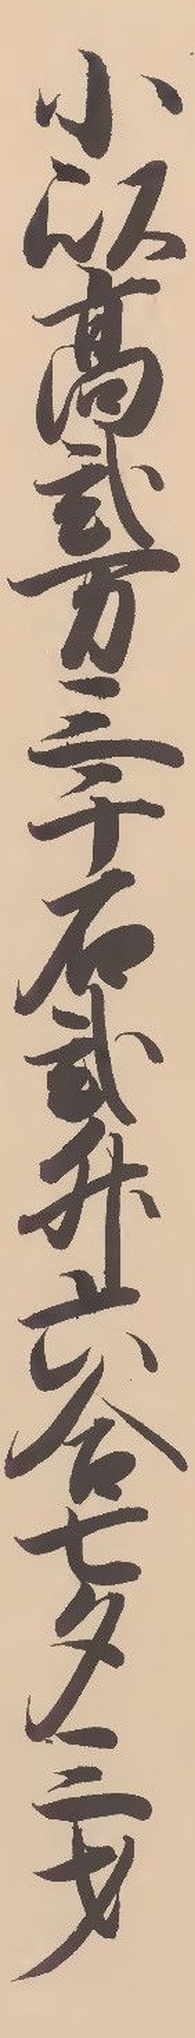小以高弐万三千石弐升六合七勺三才

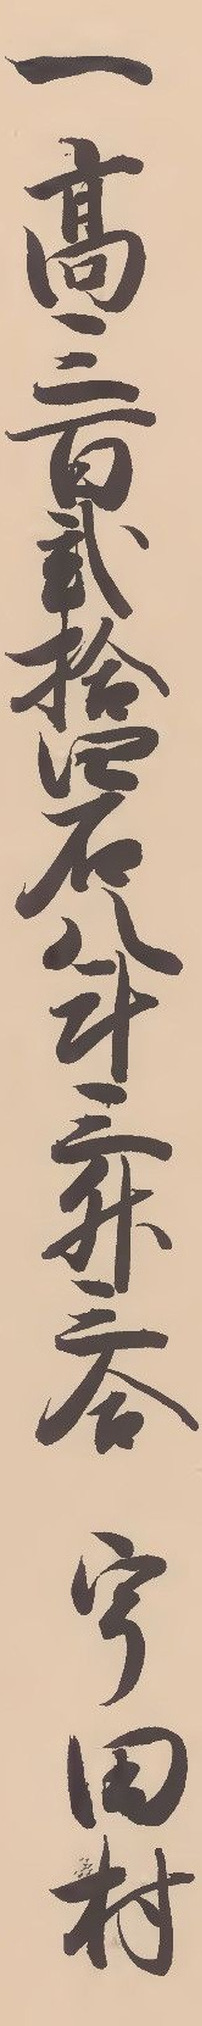一高三百弐拾四石八斗三升三合宇田村
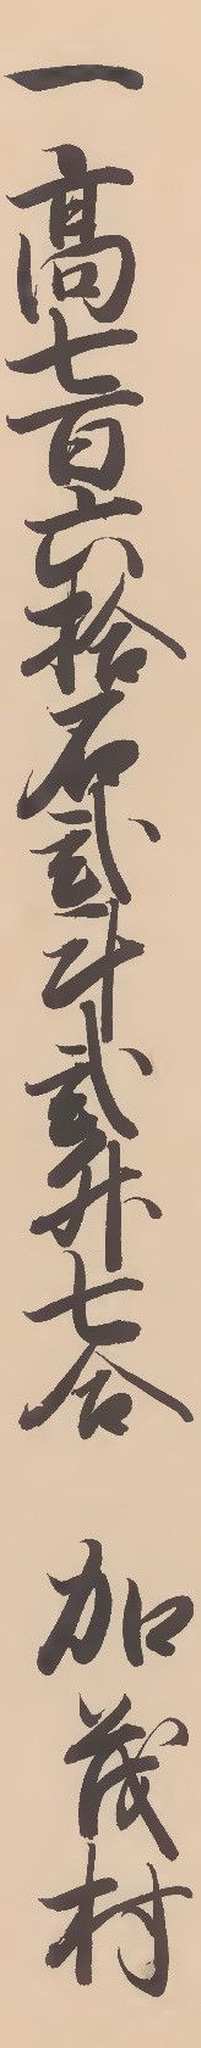一高七百六拾石弐斗弐升七合加茂村
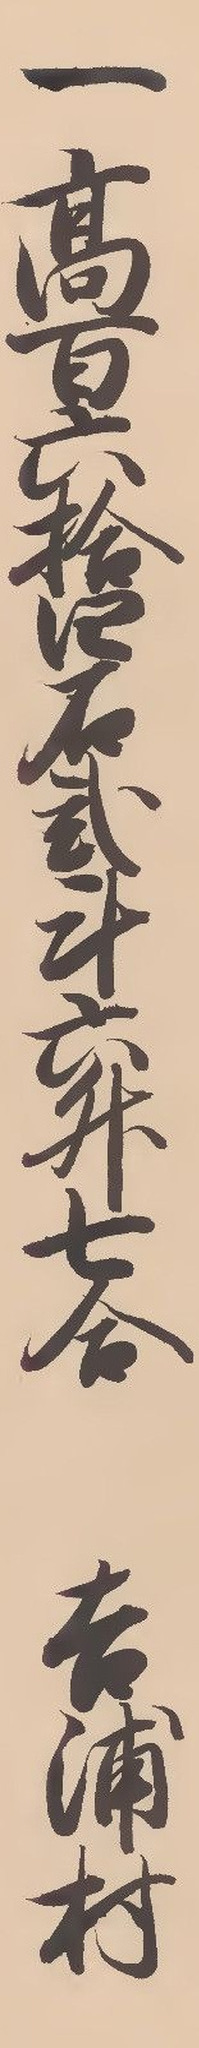一高百六拾四石弐斗六升七合吉浦村
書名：安房国郷帳
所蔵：国立公文書館 National Archives of Japan
